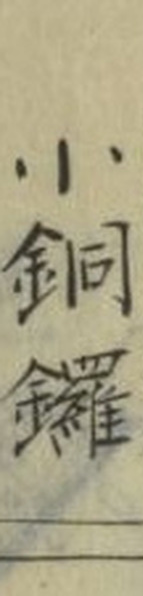小銅鑼

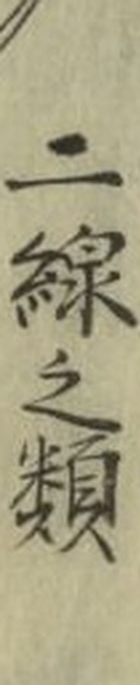二線之類
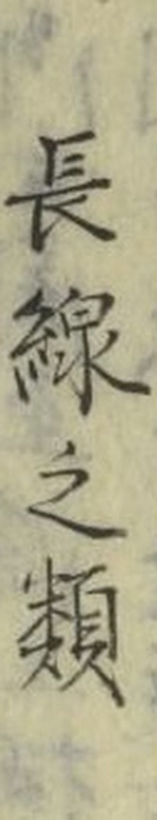長線之類

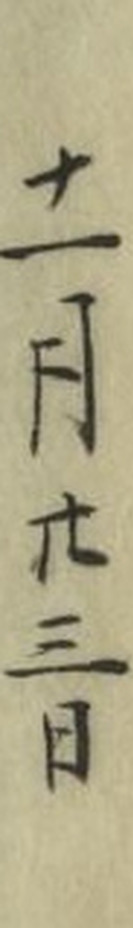十一月廿三日
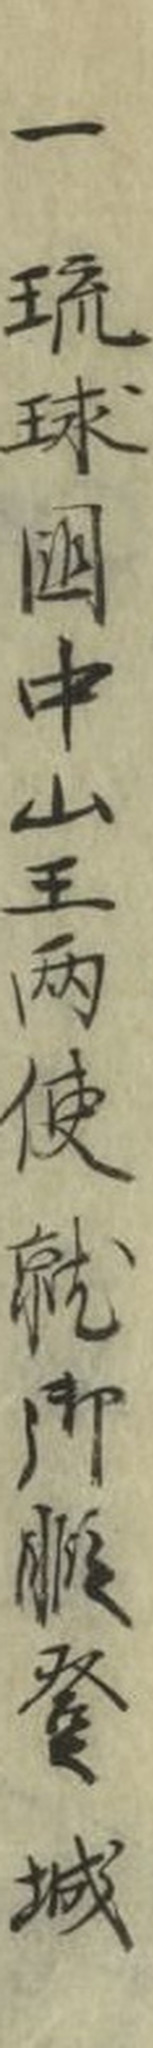一琉球国中山王両使就御暇登城
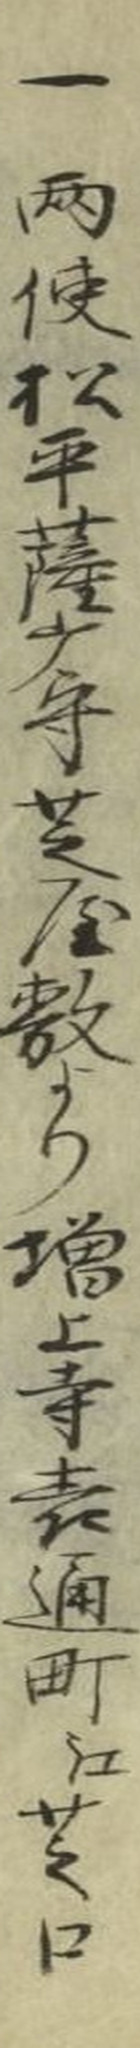一両使松平薩摩守芝屋敷より増上寺表通町え芝口
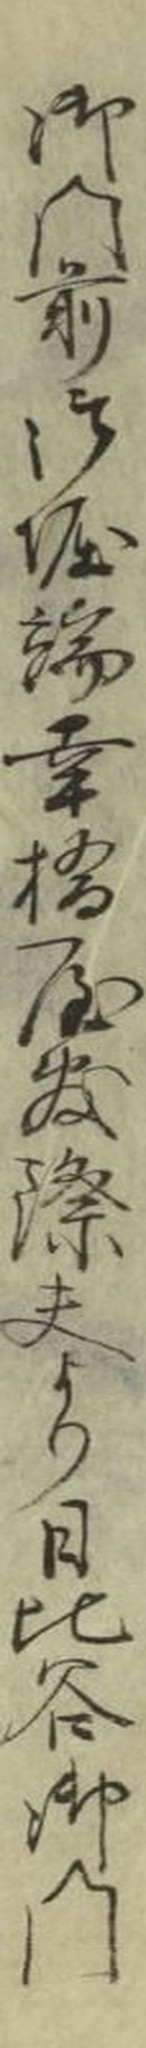御門前御堀端幸橋屋敷際夫より日比谷御門
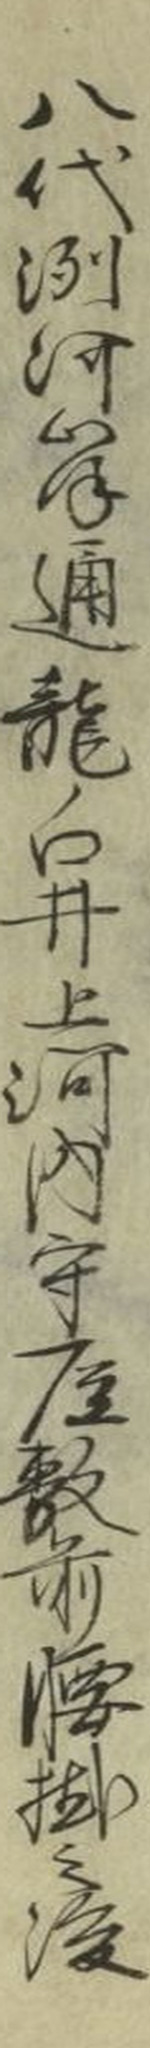八代州河岸通龍ノ口井上河内守屋敷前腰掛之後
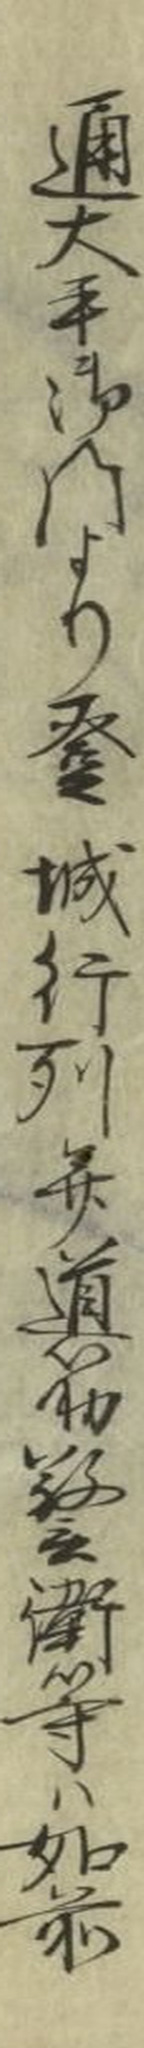通大平御門より登城行列幷道筋警衛等は如前
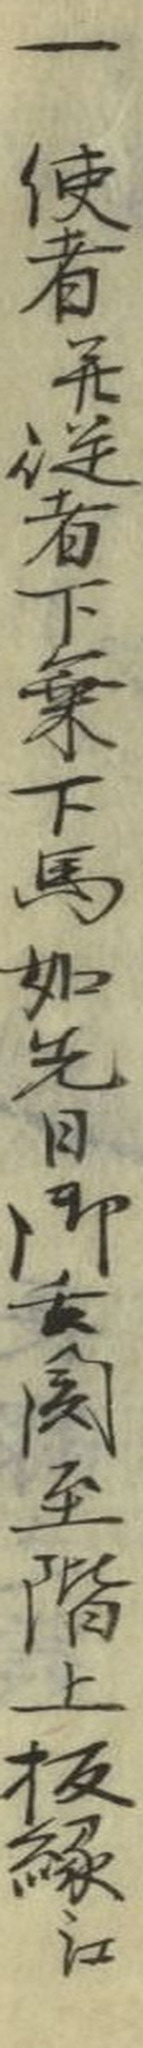一使者幷従者下乗下馬如先日御玄関至階上板縁え
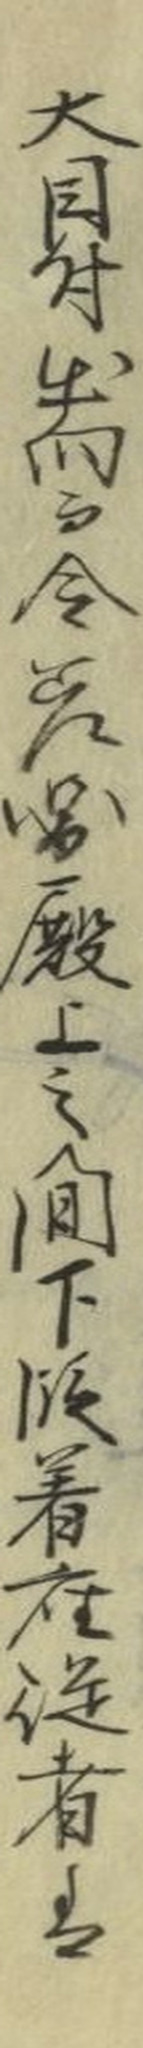大目付出向而令差図殿上之間下段着座従者は
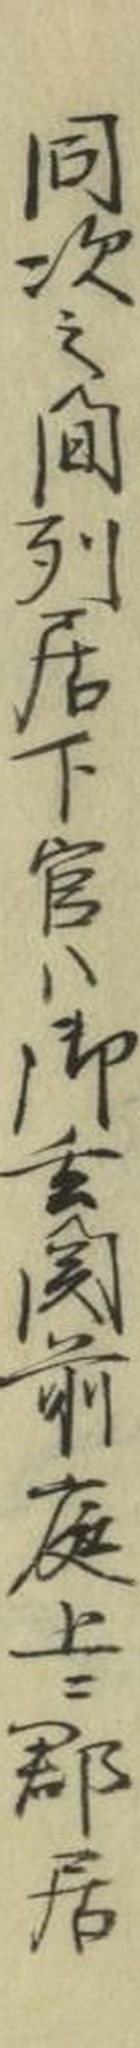同次之間列居下官は御玄関前庭上に群居
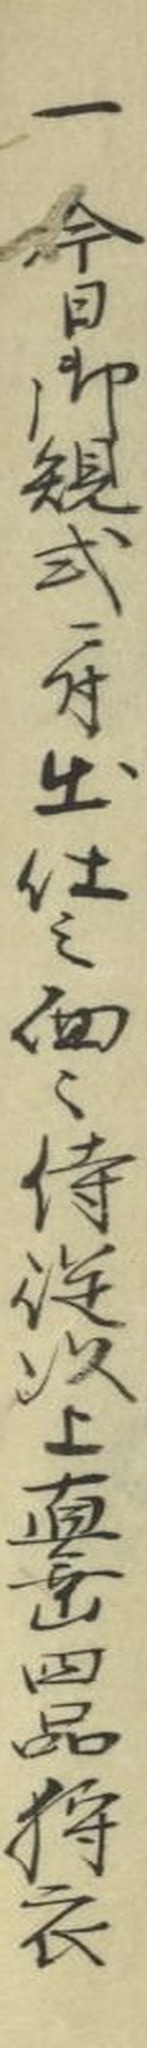一今日御規式に付出仕之面々侍従以上直垂四品狩衣
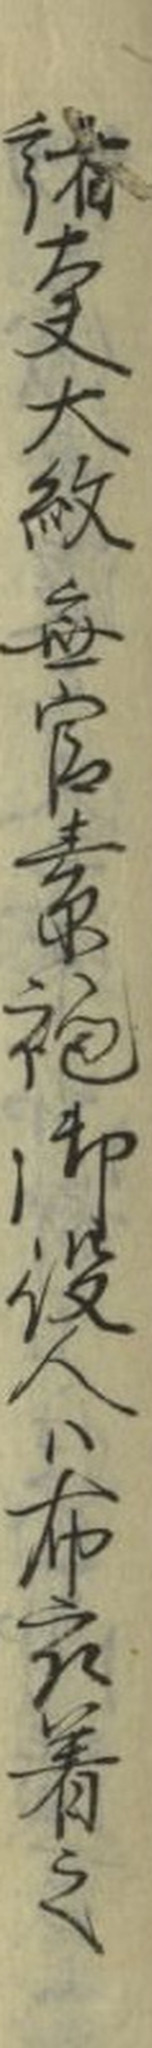諸大夫大紋無官素袍御役人は布衣着之
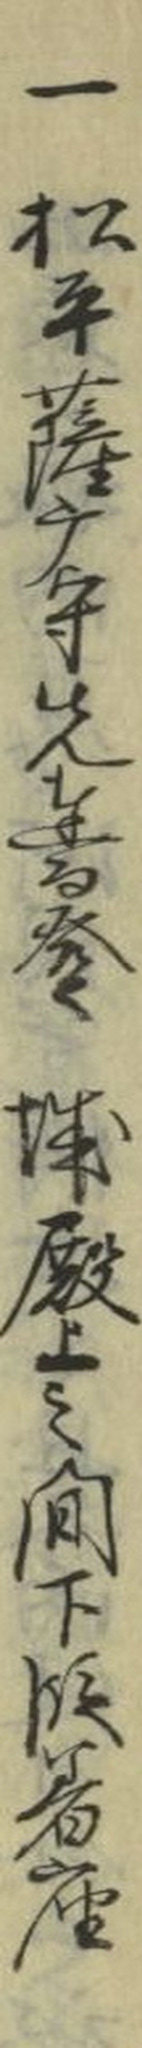一松平薩摩守先達而登城殿上之間下段着座
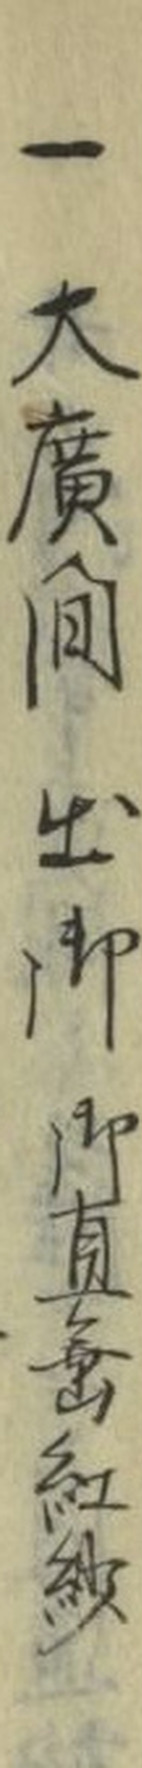一大広間出御御直垂紅紗
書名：宝永七庚寅年琉球国来聘使日記
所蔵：University of the Ryukyus Library
